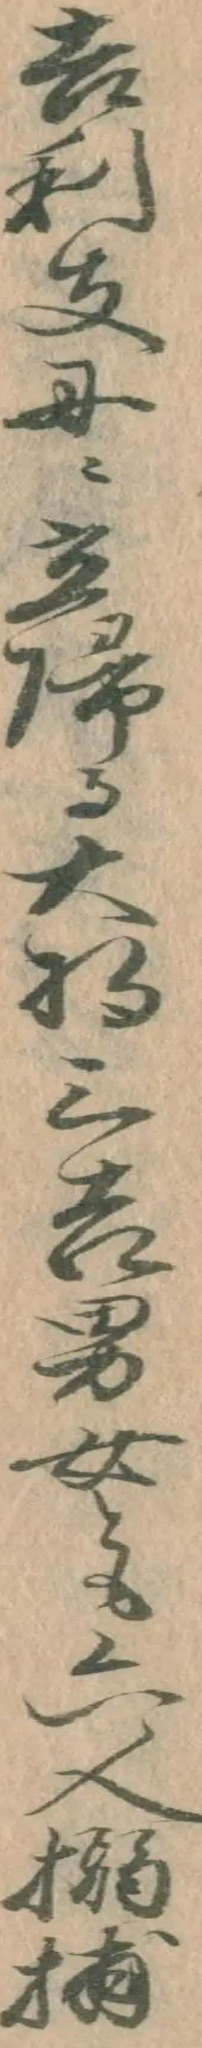吉利支丹に立帰る大将三吉男女とも六人搦捕
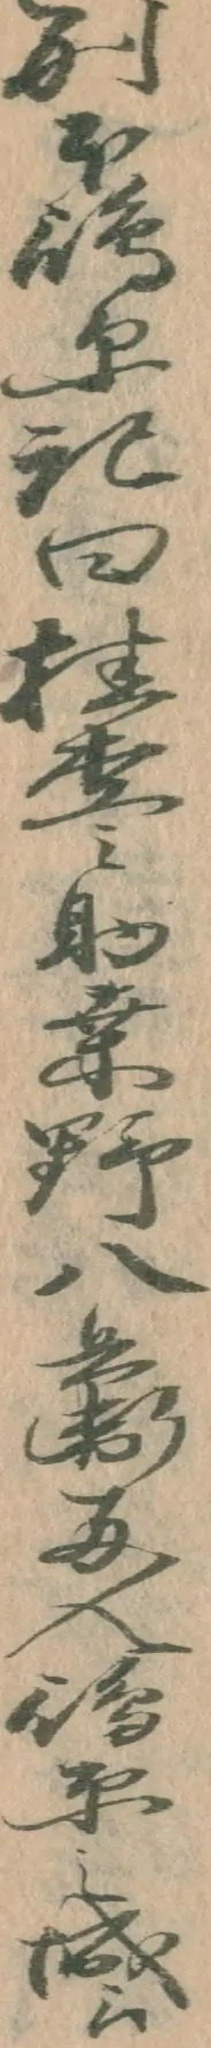別本島原記日桂杢之助桑野八兵衛両人島原之城え
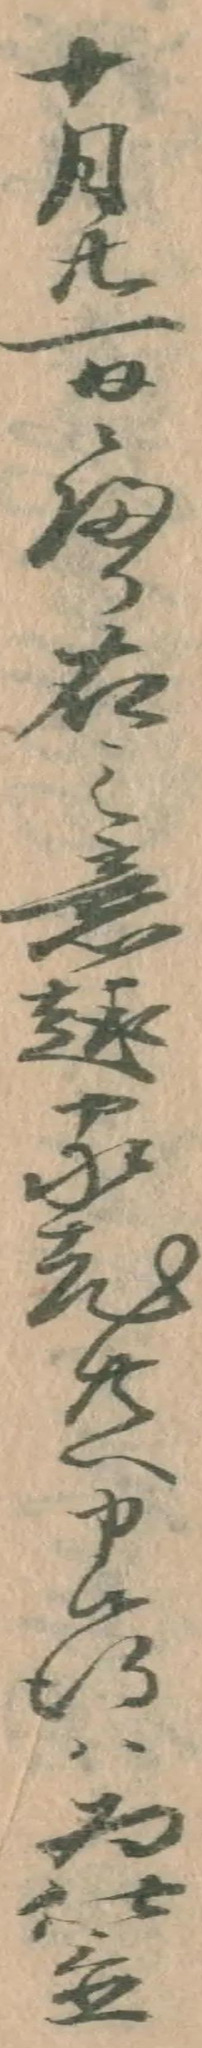十月廿一日に帰り右之意趣家老共へ申候得は為仕置
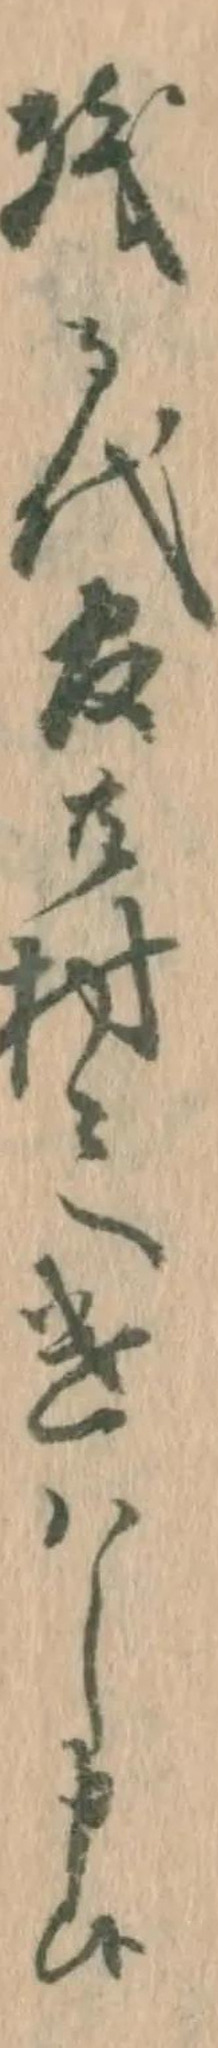残る代官共村々へ遣はし申候
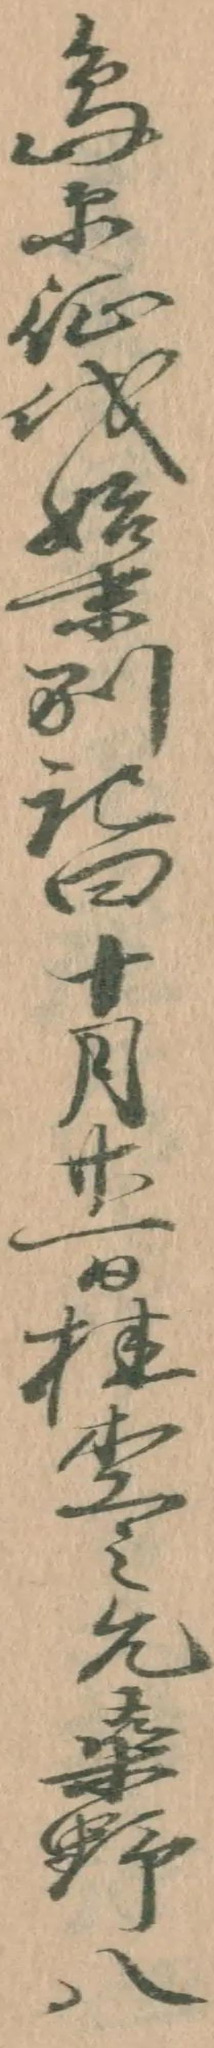島原征伐始末別記日十月廿一日桂杢之允桑野八
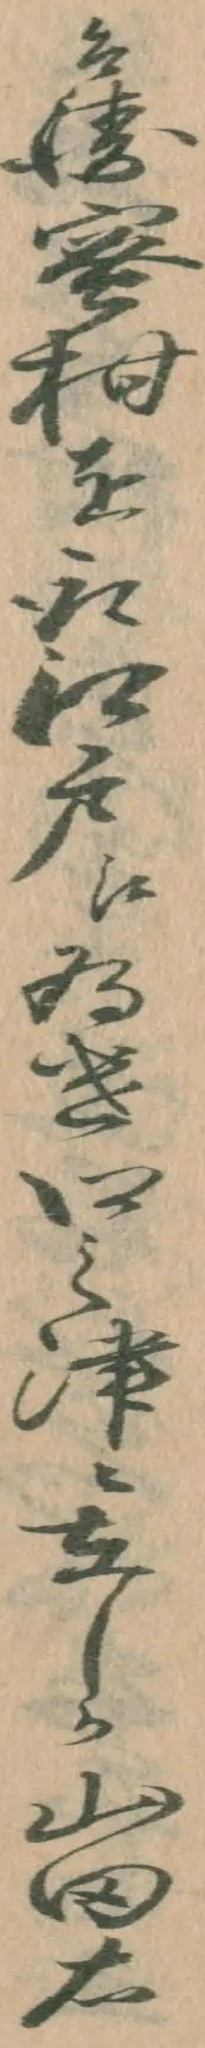兵衛蜜柑を取江戸え為遣口之津に在しか山田右
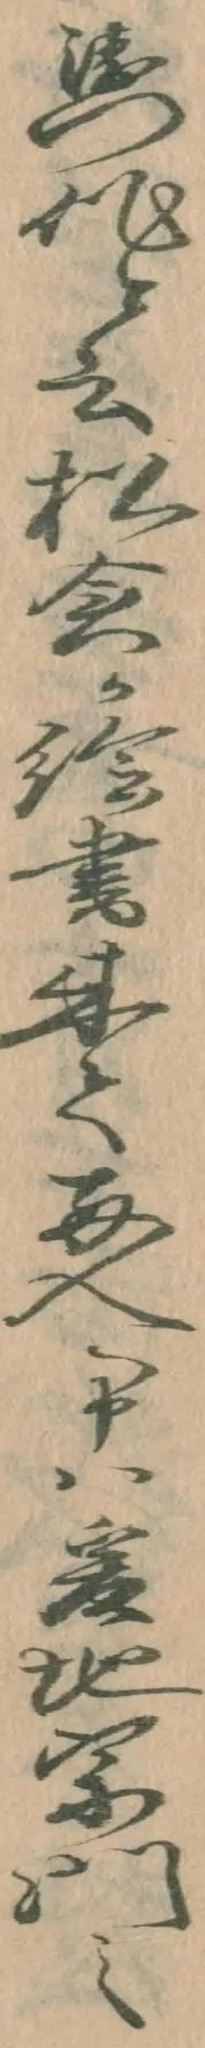衛門作と云松倉か絵書来て両人へ申は爰地宗門之
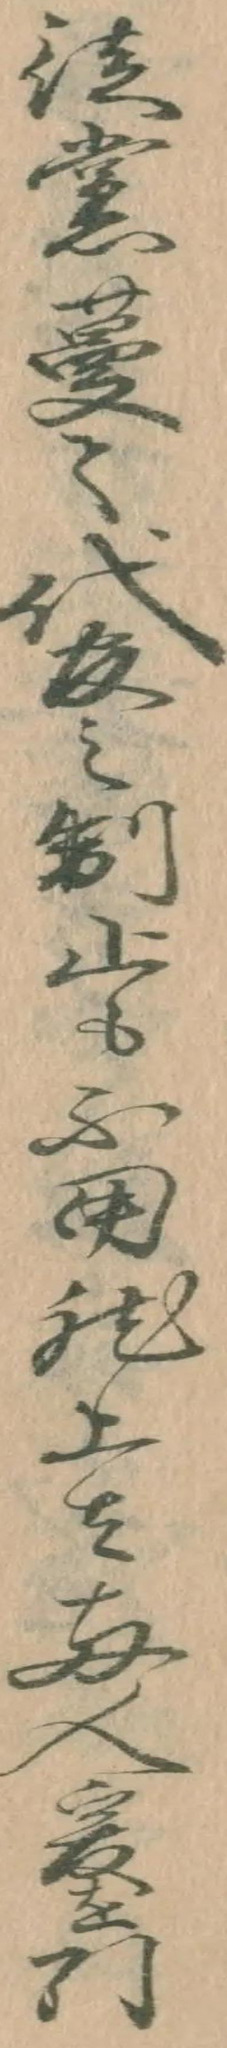徒党蔓て代官之制止も不用然上は両人爰を引
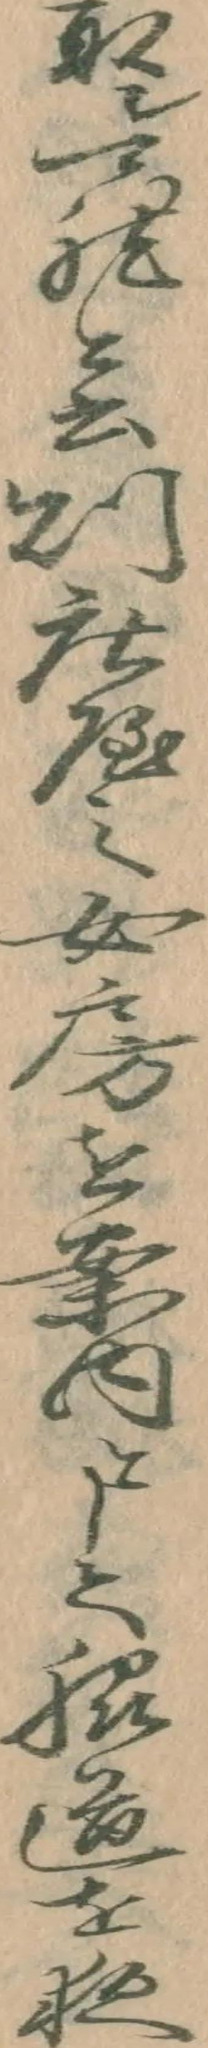取し可然と云則庄屋之女房を案内として脇道を夜
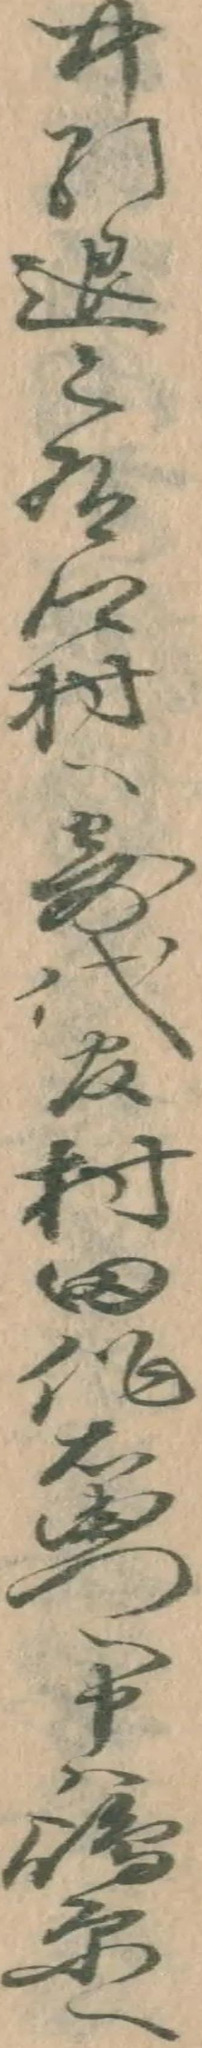中引退て有江村へ寄代官村田作右衛門へ申は島原へ
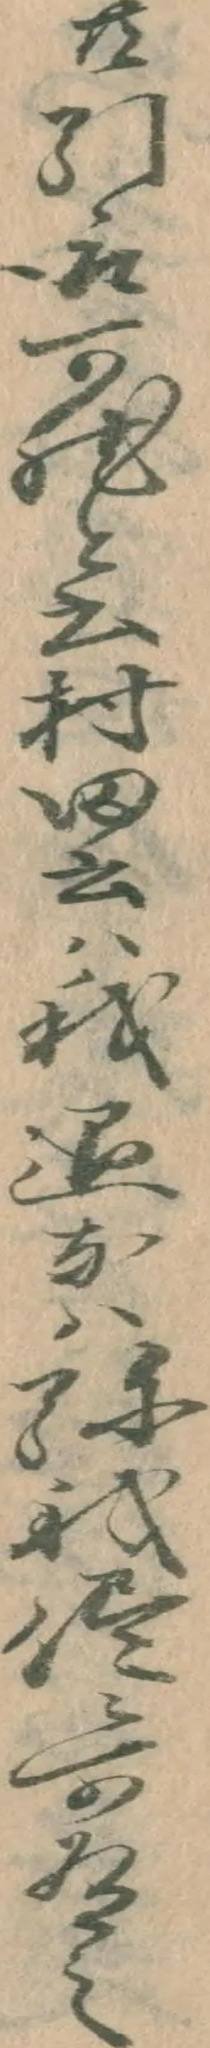共引取可然と云村田云は我退なは弥我侭に可有之
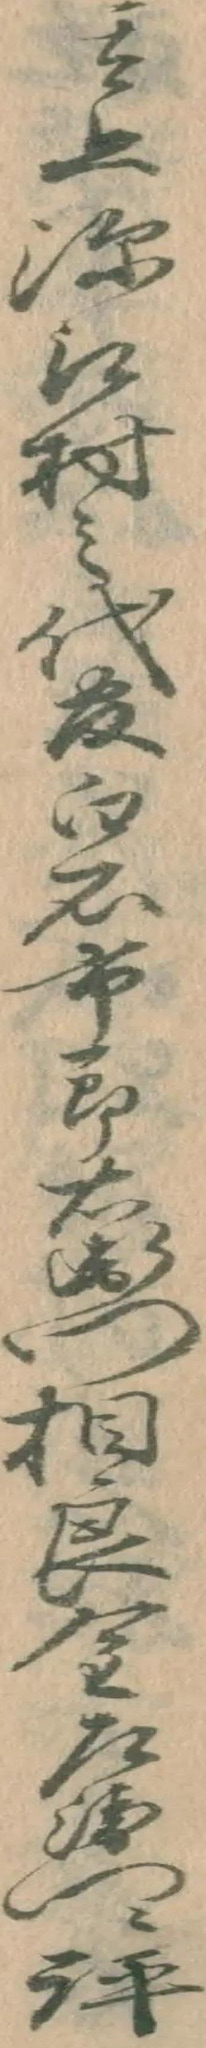其上深江村之代官白石市郎右衛門相良金左衛門に評
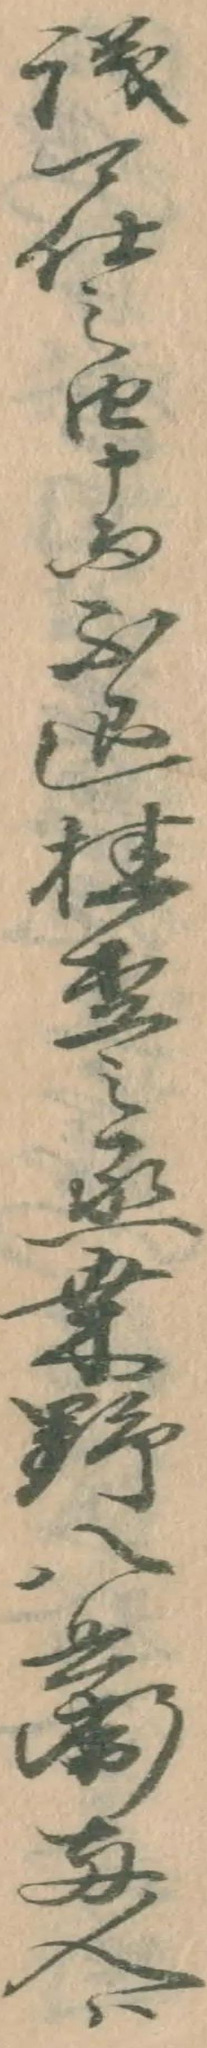議可仕之由申而不退桂杢之丞桑野八兵衛両人は
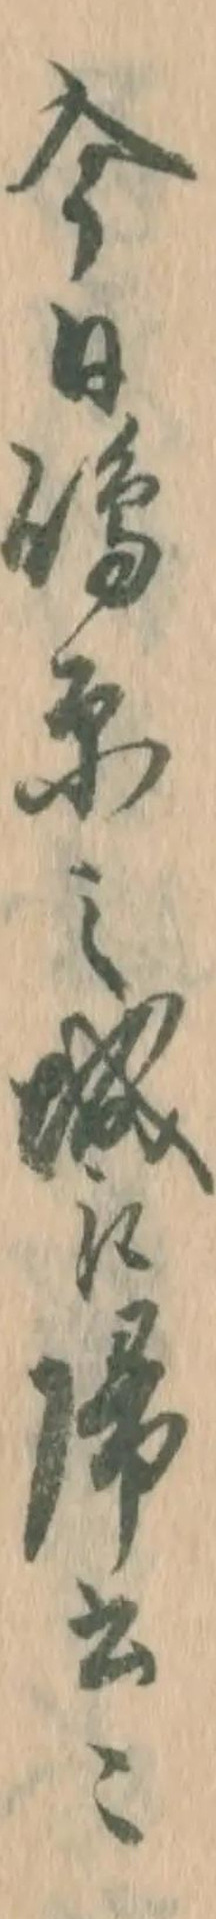今日島原之城え帰云々
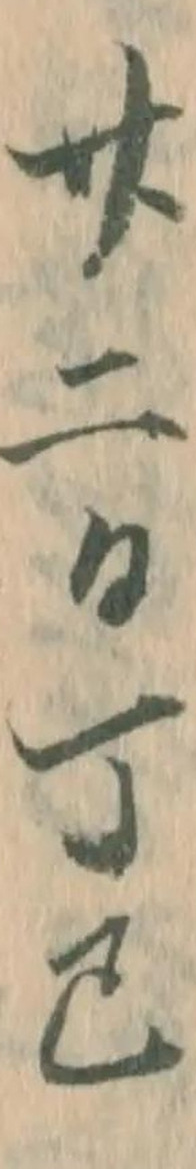廿二日丁巳

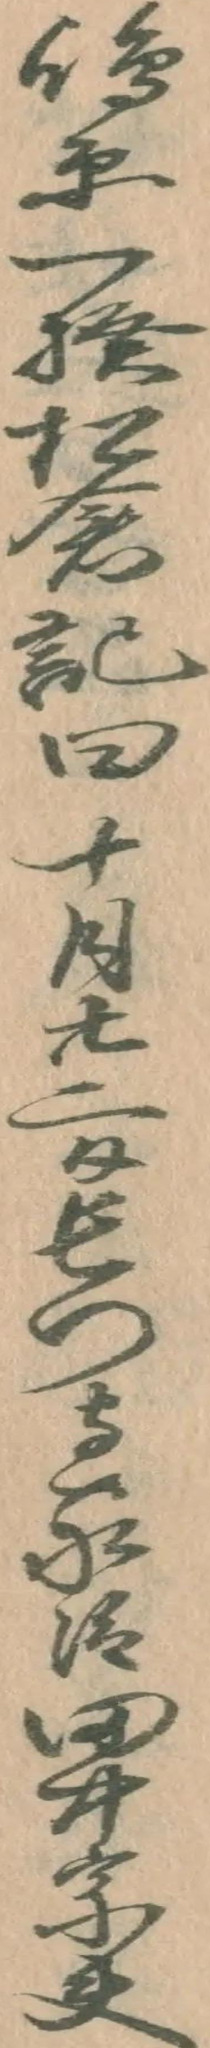島原一揆松倉記日十月廿二日長門守家臣田中宗夫
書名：切支丹御退治記 49巻. [1]
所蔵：国立国会図書館 National Diet Library, JAPAN
